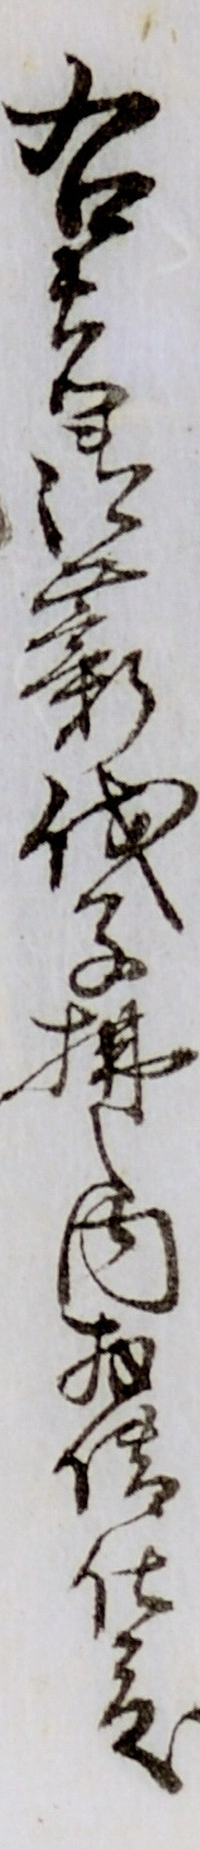右は御薪伐子払之内拝借仕度
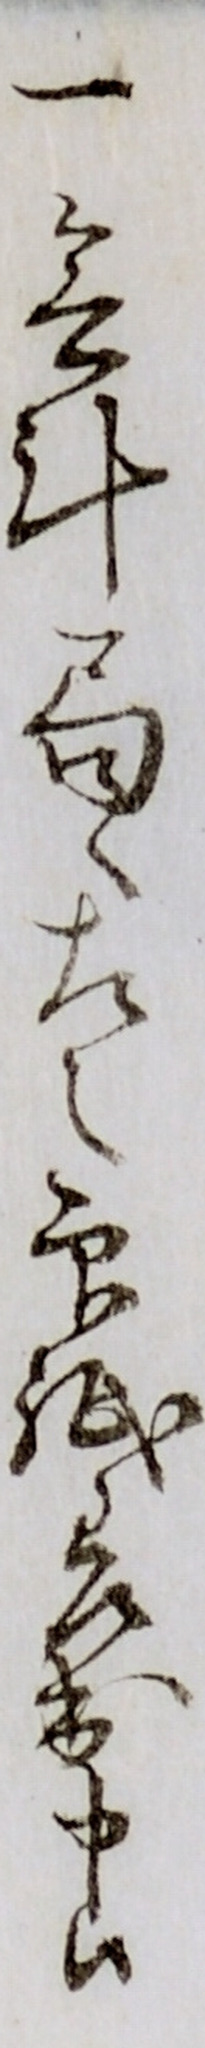一会計局へ左之印紙差出申候
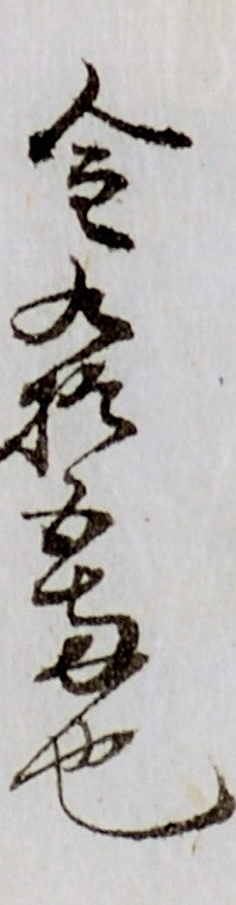金九拾五両也
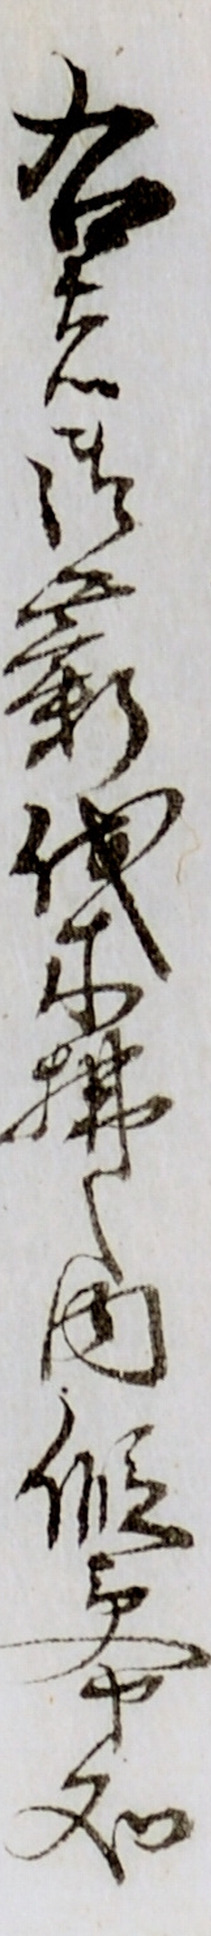右は御薪伐子払之内仮受申処
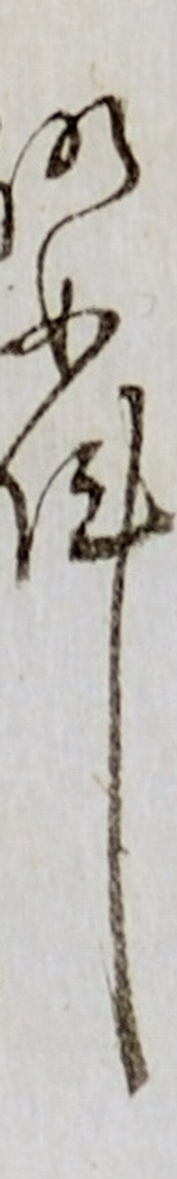仍如件
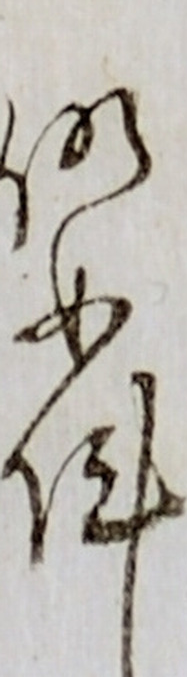仍如件
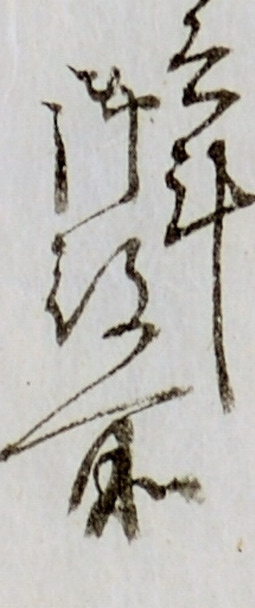御役所
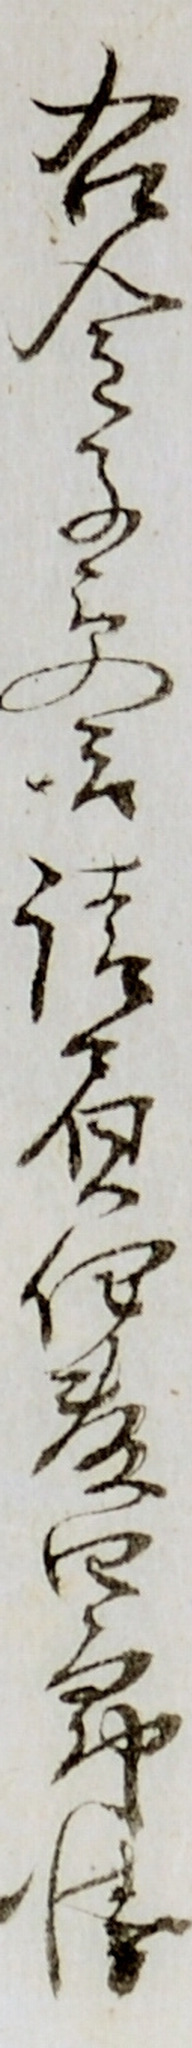右金子受取請負伊藤四郎兵衛
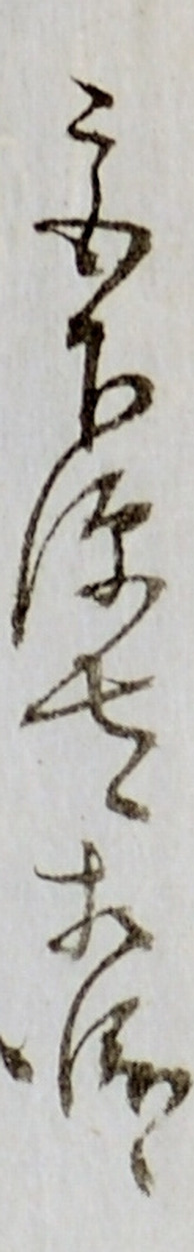宮下源七へ相渡候
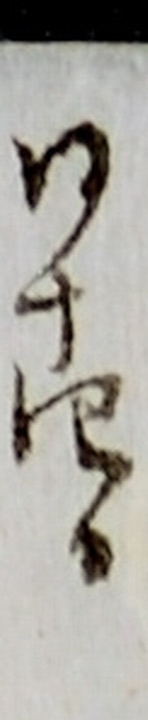同十五日
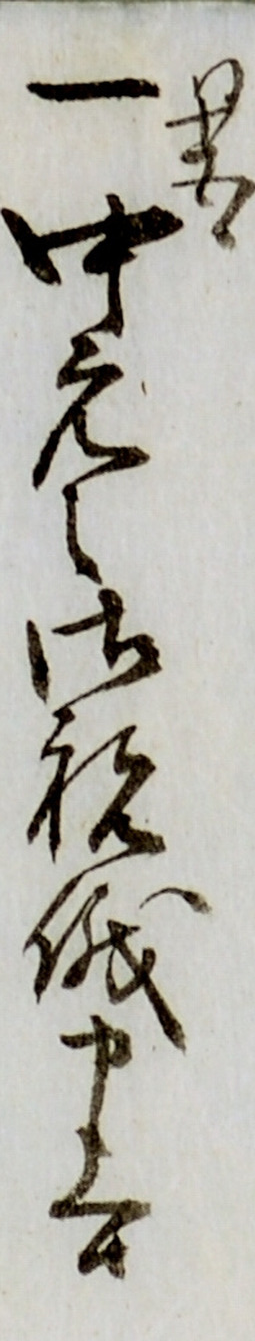一中元之御祝儀申上候
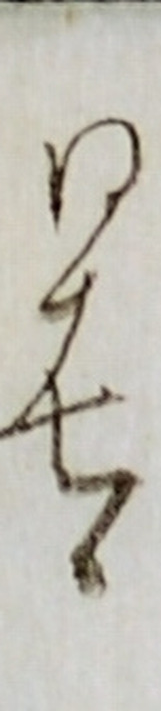同十七日
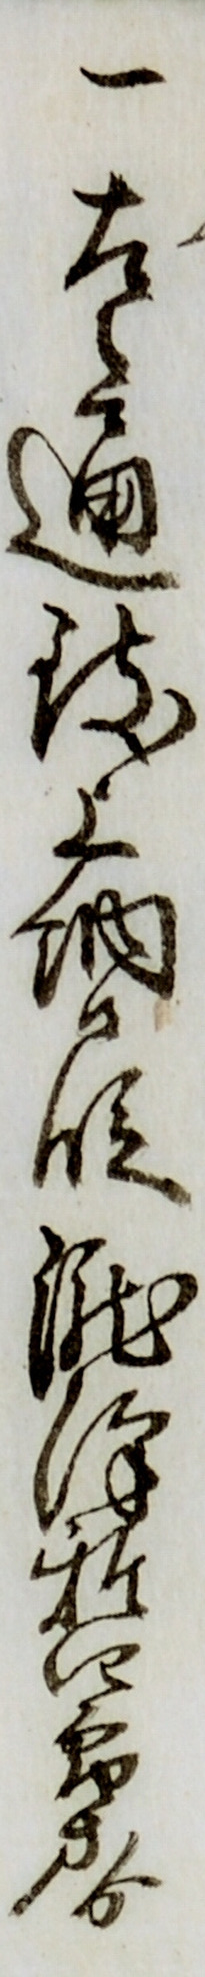一左之通致上納候段滝沢雅四郎方ゟ
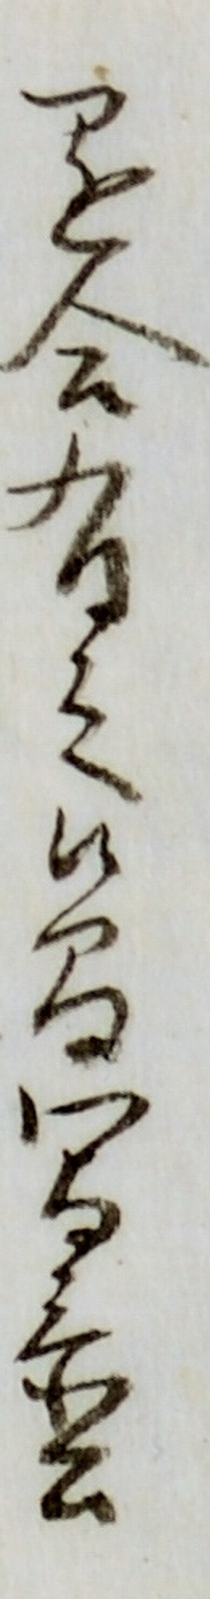懸合有之候間写置候
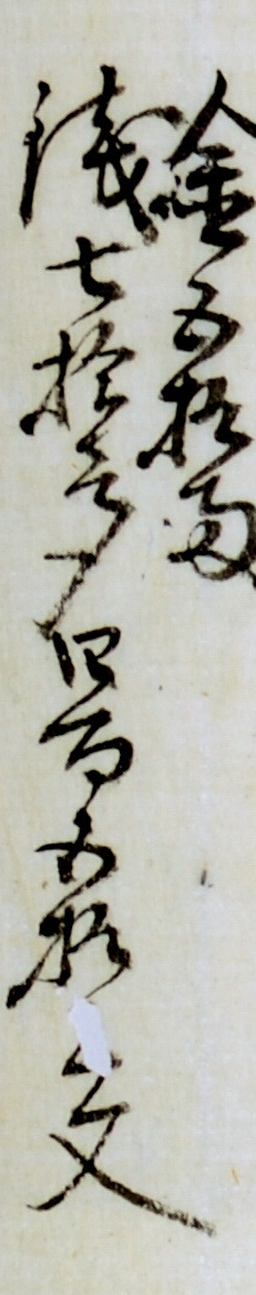銭七拾壱貫四百五拾文

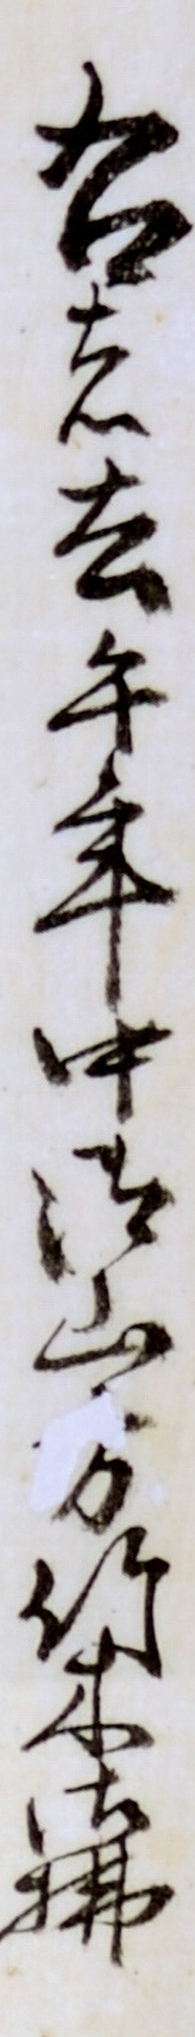右は去午年中御山方竹木御払
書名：山林方諸事御用留
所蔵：伊那市立高遠町図書館・合同会社AMANE
